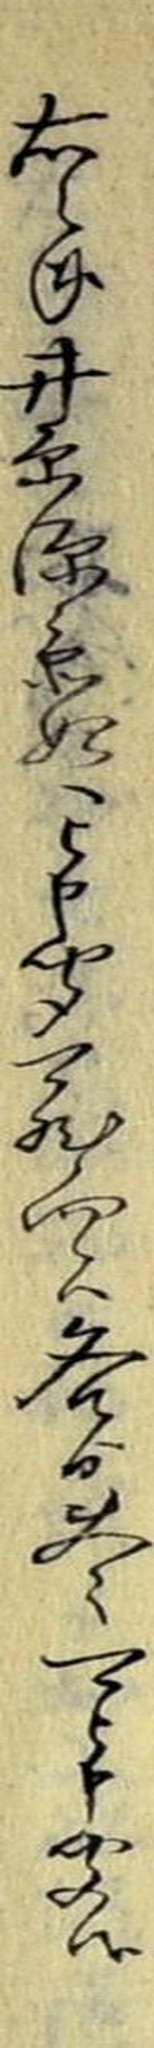右之通井原源兵衛始へ被申聞可然向へは各ゟ夫々可被申聞候
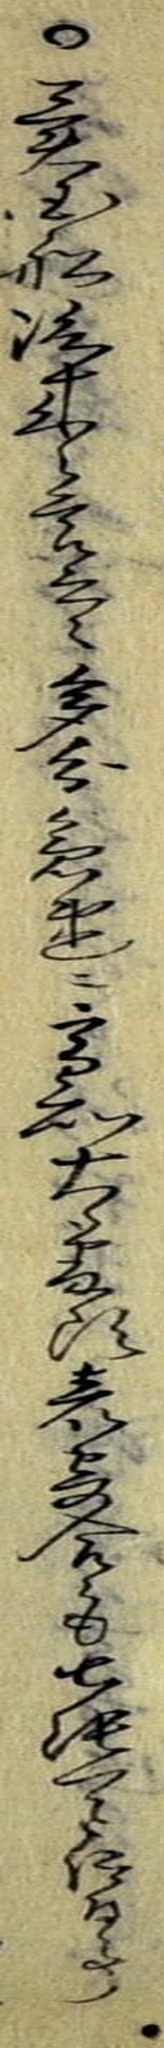○異国船渡来之節云々多分急速に高知大御番頭表寄合へも出張可被仰付候
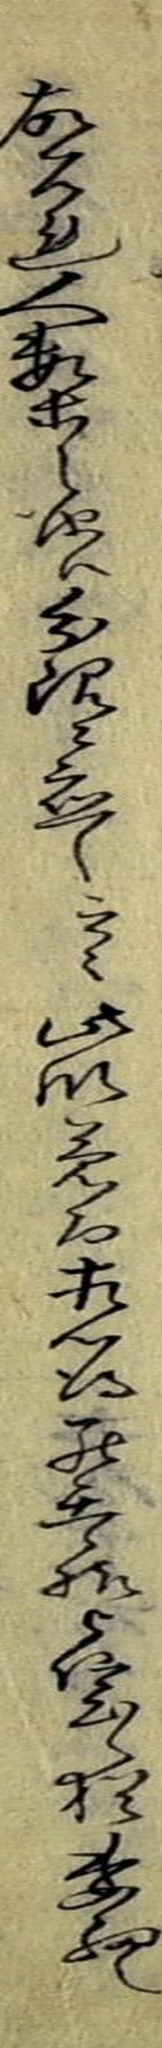右召連等之人数之儀は分限に応し云々此段兼而相心得罷在候様被仰出候猶委細之
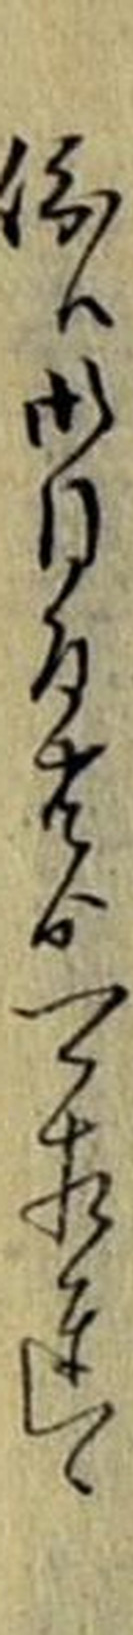儀は御目付共ゟ可相達候

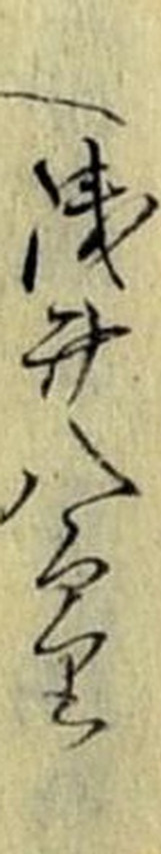浅井八百里
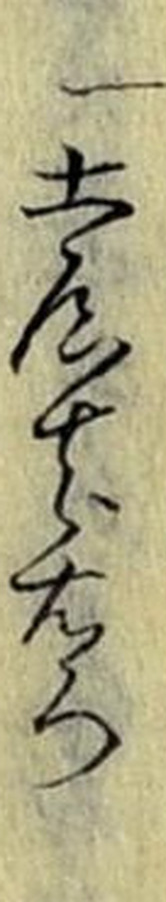土屋十郎右衛門
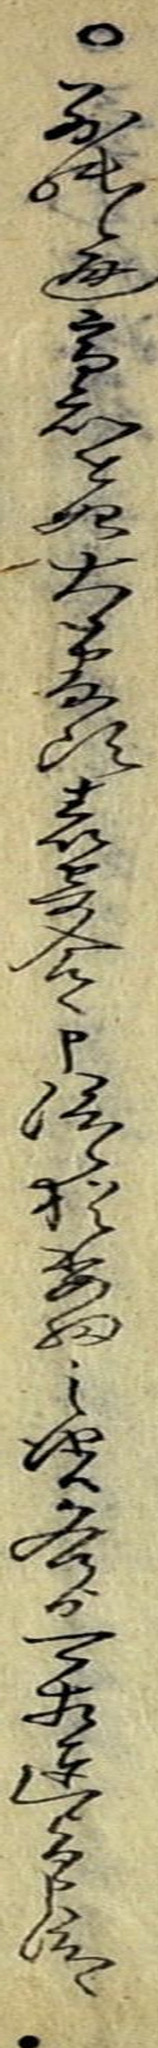○別紙之通高知を始大御番頭表寄合へ申渡候猶委細之儀は各ゟ可相達旨申渡候
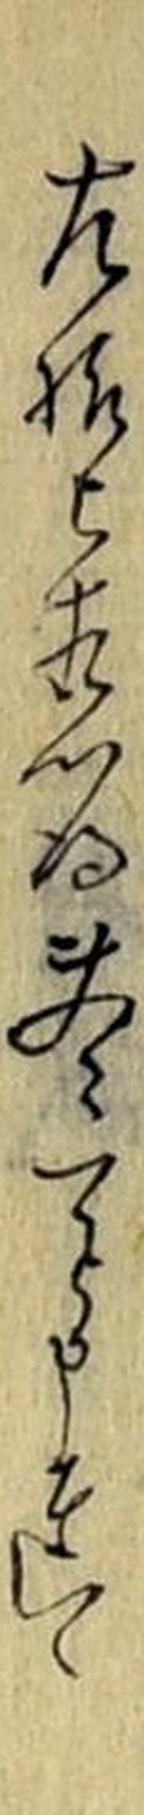左様被相心得夫々可被達候
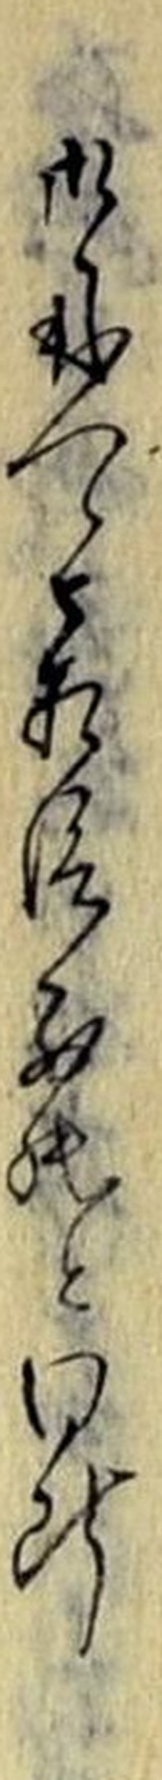御用人被相渡別紙と同断
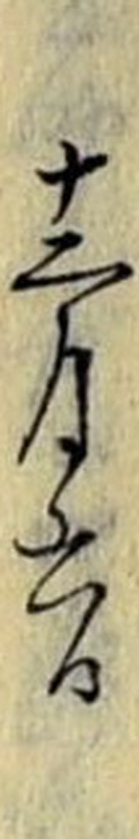十二月六日
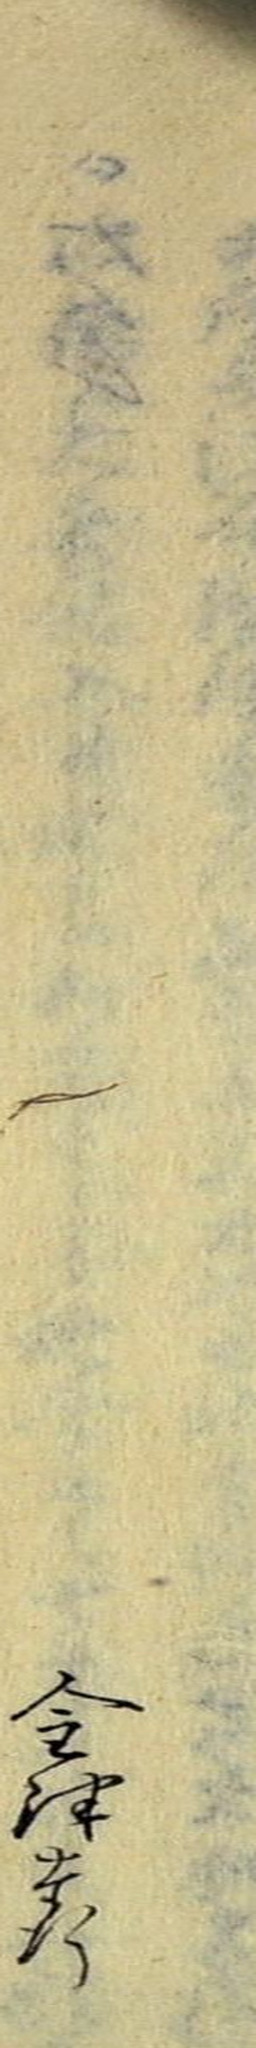金津奉行
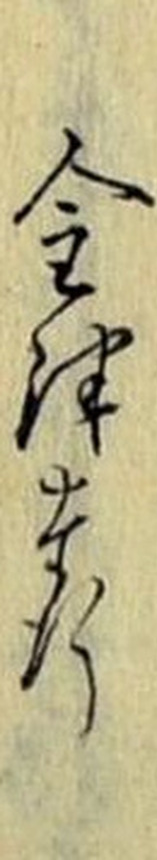金津奉行
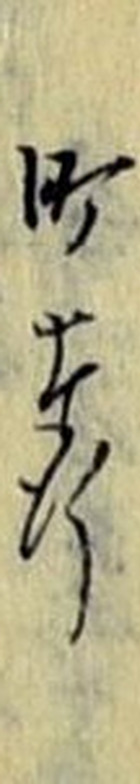町奉行
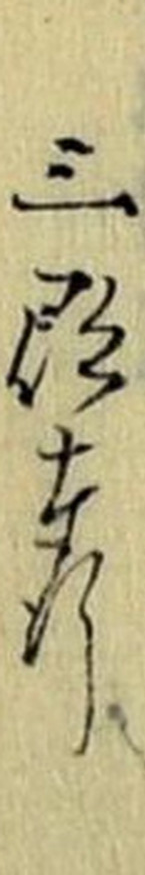三郡奉行
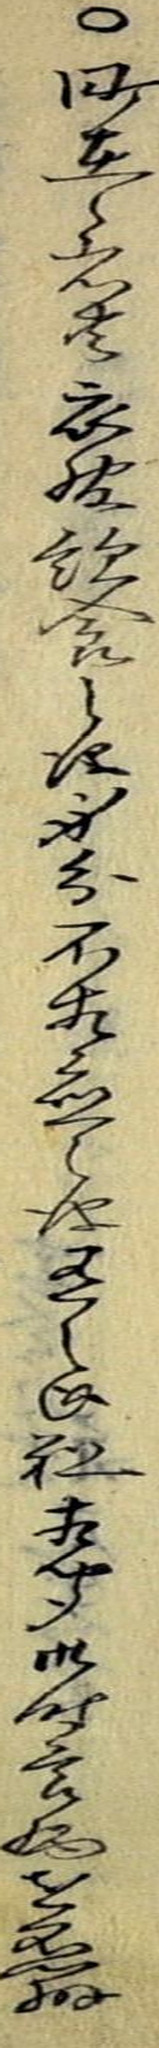○町在之者共衣服飲食之儀身分不相応之儀有之趣粗相聞御時節柄を不弁
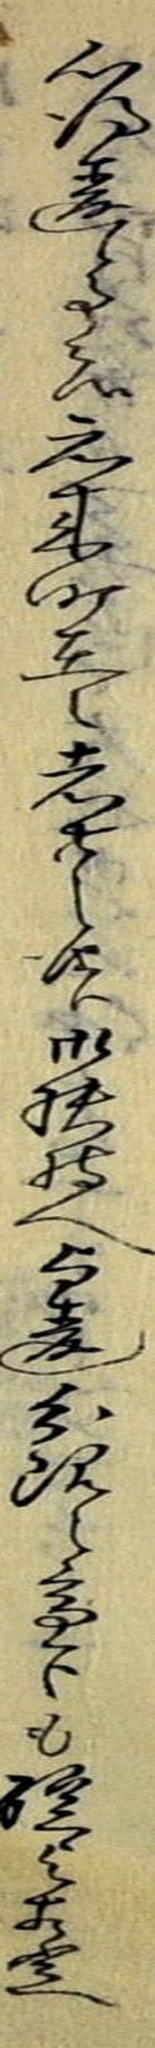心得違之事に候元来町在之者共之儀は御扶持人と違分限之高下も聢と定
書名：命令之部 六
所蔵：福井県文書館 Fukui Prefectural Archives
